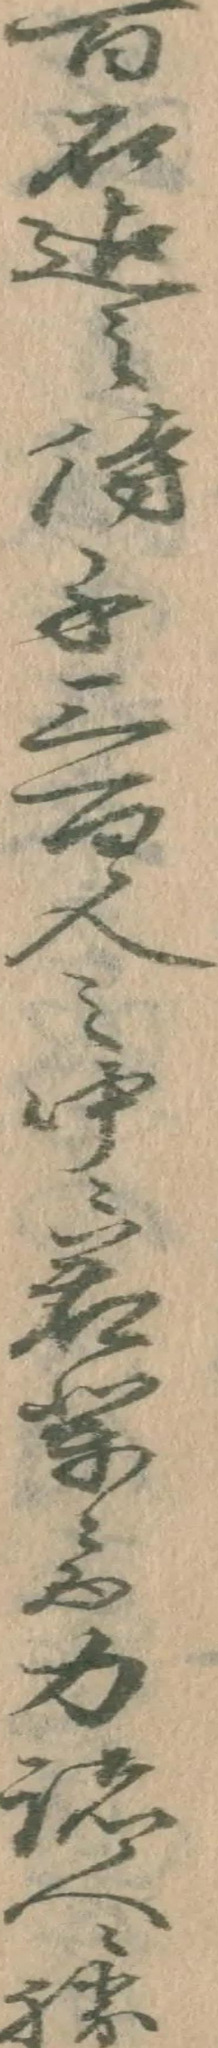百石迄之侍千三百人之中に若輩に而力諸人に勝
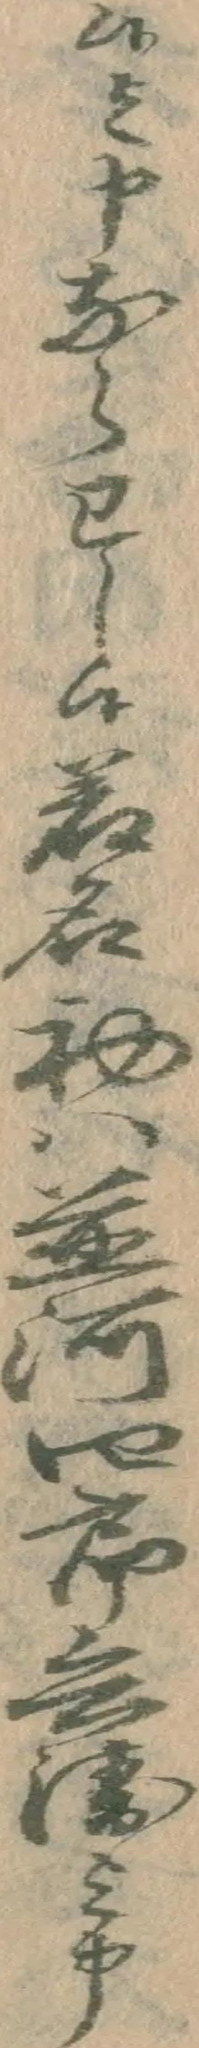候与申なら已し候若名初は並河四郎兵衛与申
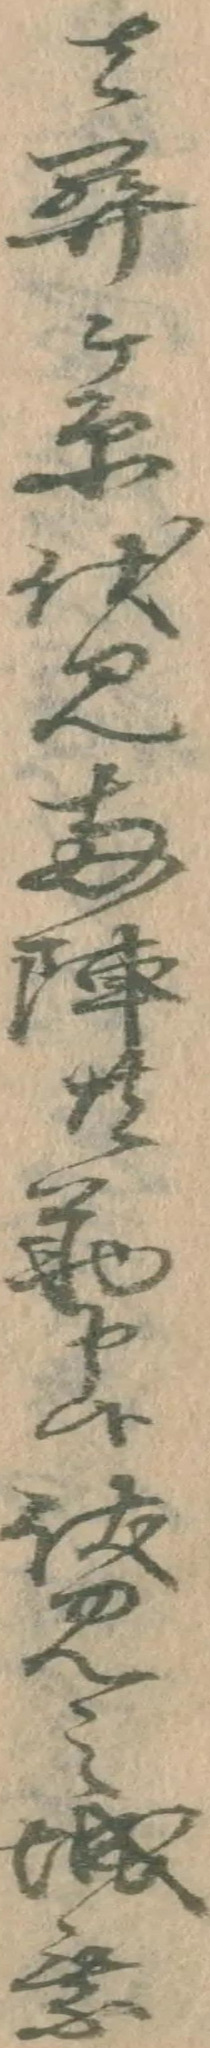者関け原伏見両陣共勤申候伏見之城乗
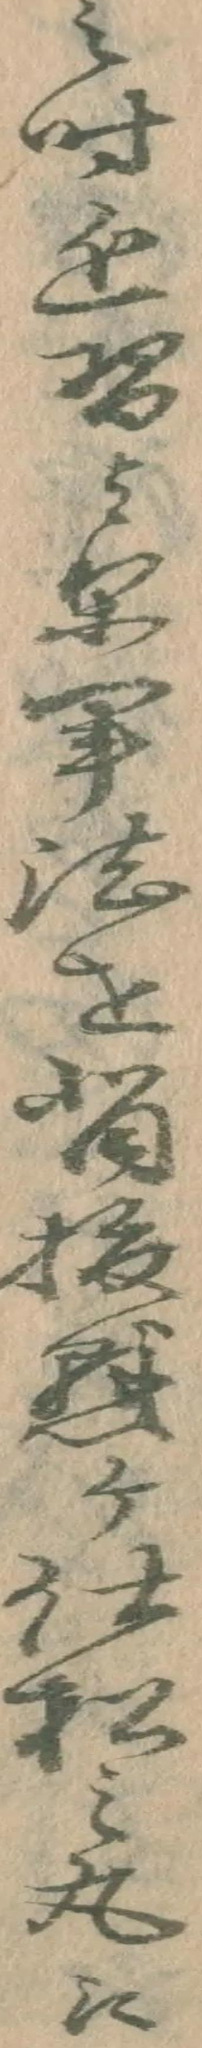之時近習与梨軍法を背抜懸け仕松之丸江
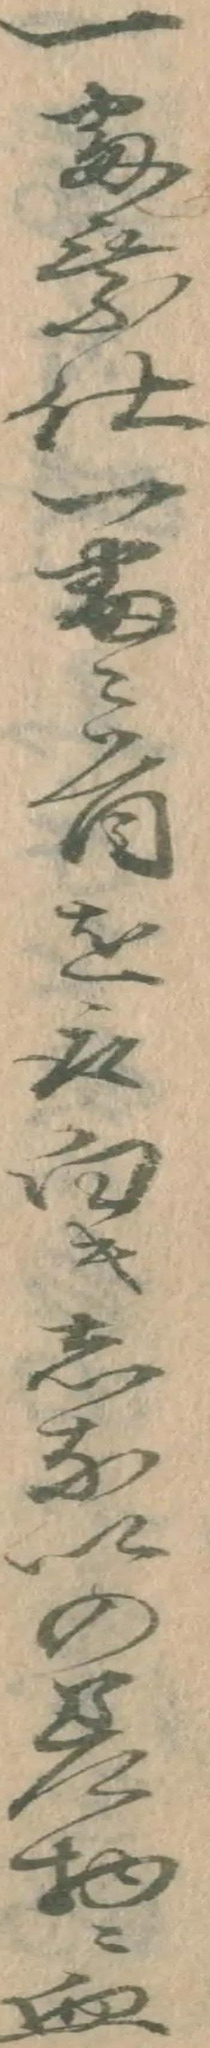一番乗仕一番に首を取白き志な以の差物に血
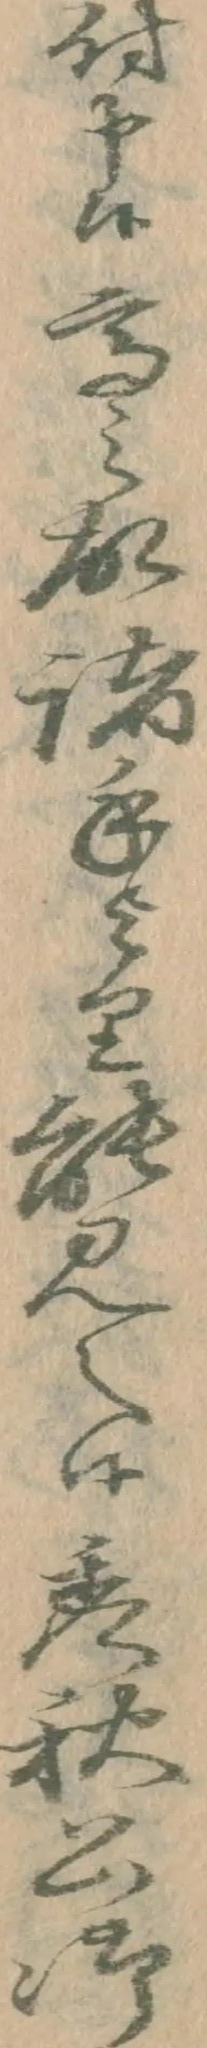付申候高之故諸手与里能見へ候秀秋公御

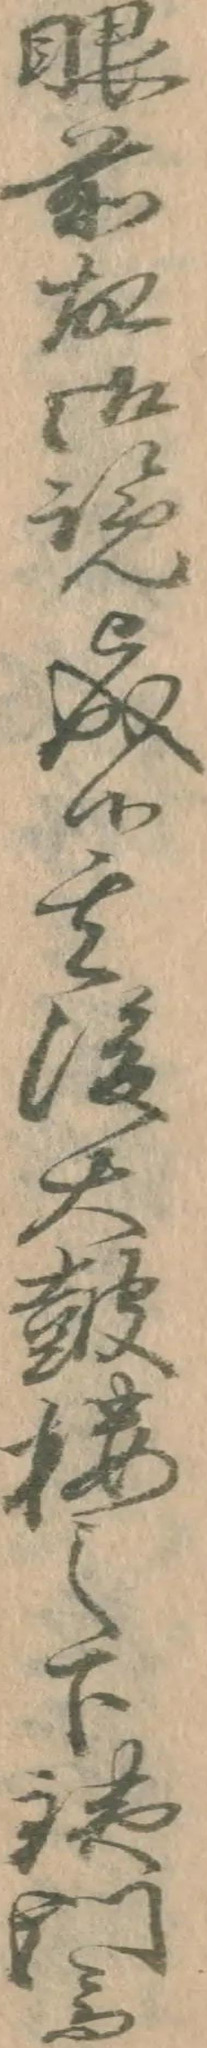眼前故御覧被成候其後大鼓樓之下鉄門に而
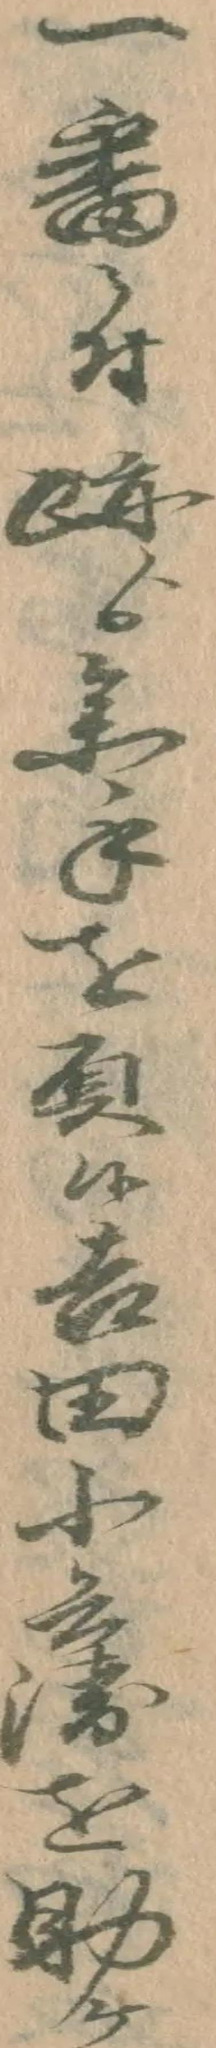一番に付跡ゟ参手を負候吉田小兵衛を助け
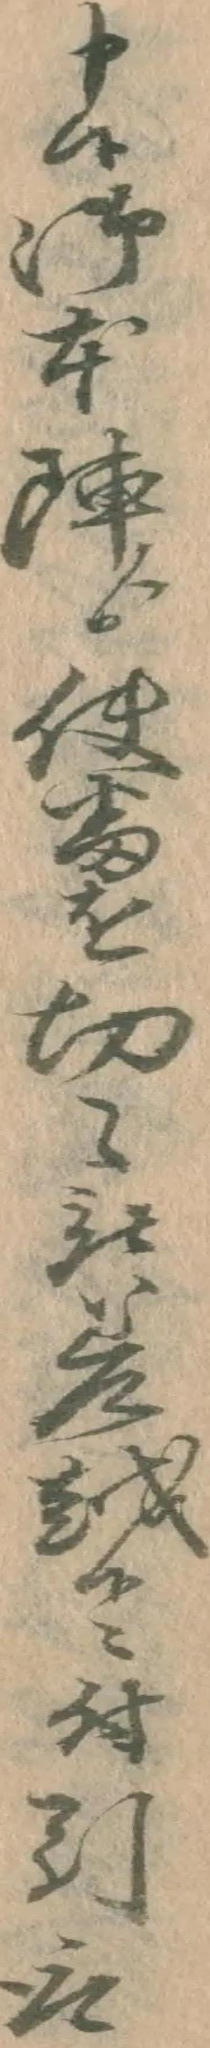申候御本陣ゟ使番を切て被差越候に付引取
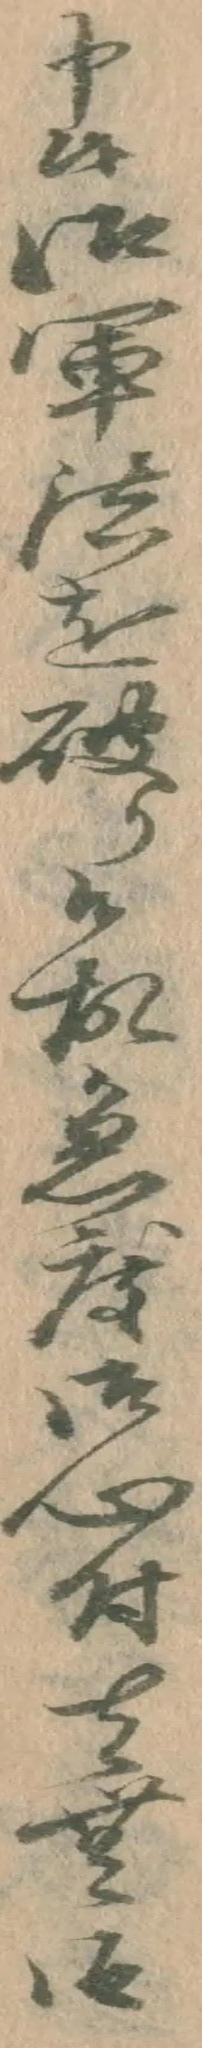申候御軍法を破り候故急度御心付者無御
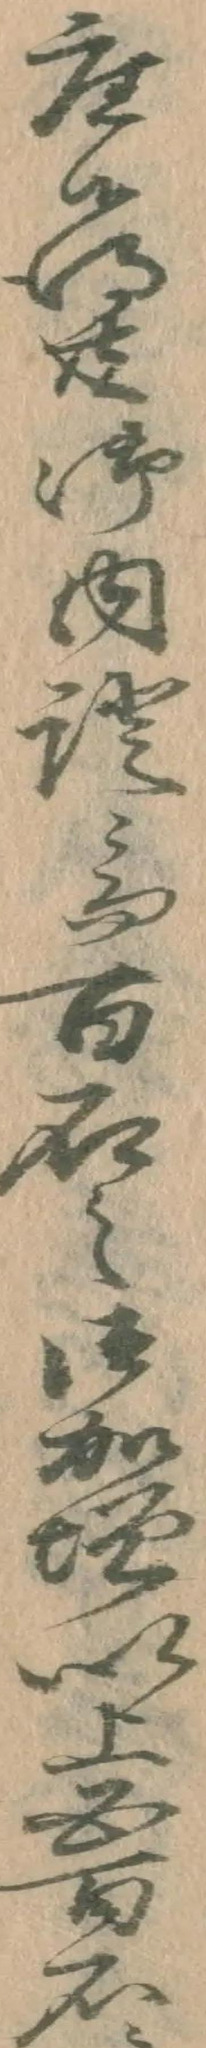座候得共御内證に而百石之御加増以上五百石に
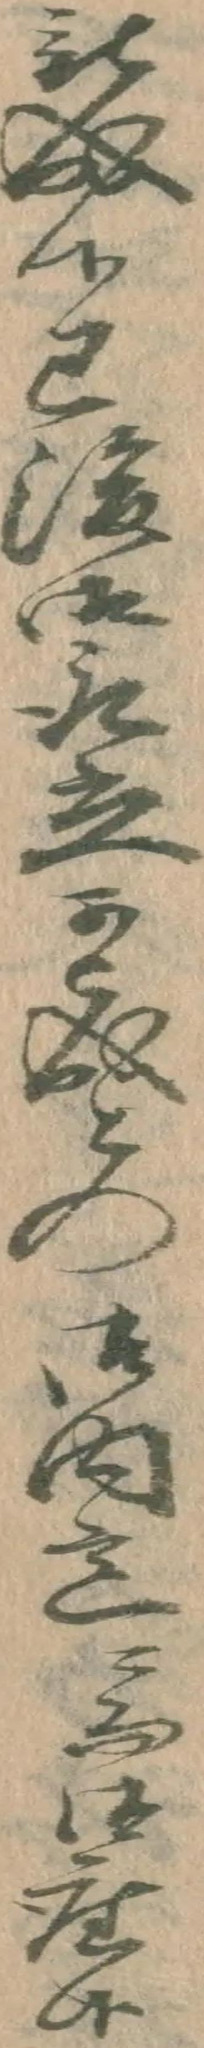被成候己後御取立可被成との御内意に而御座候
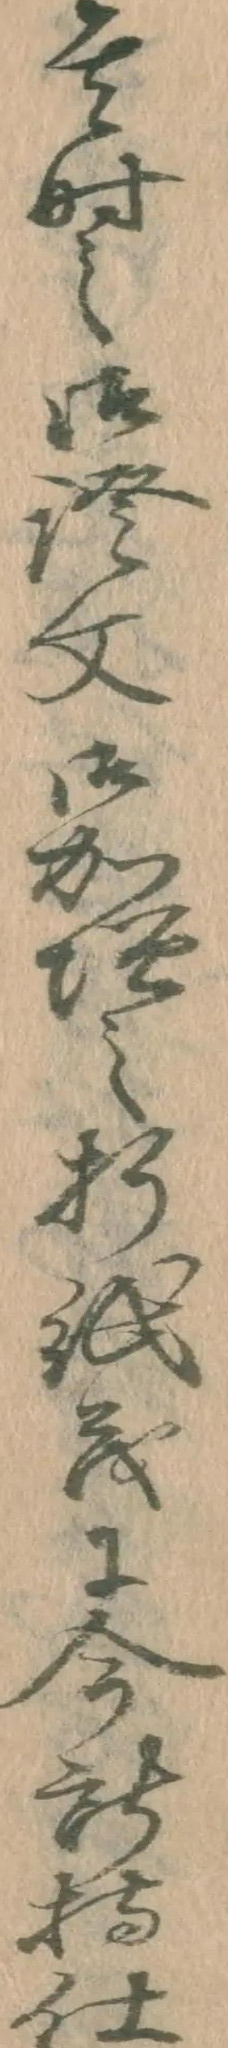其時之御證文御加増之折紙茂尓今所持仕
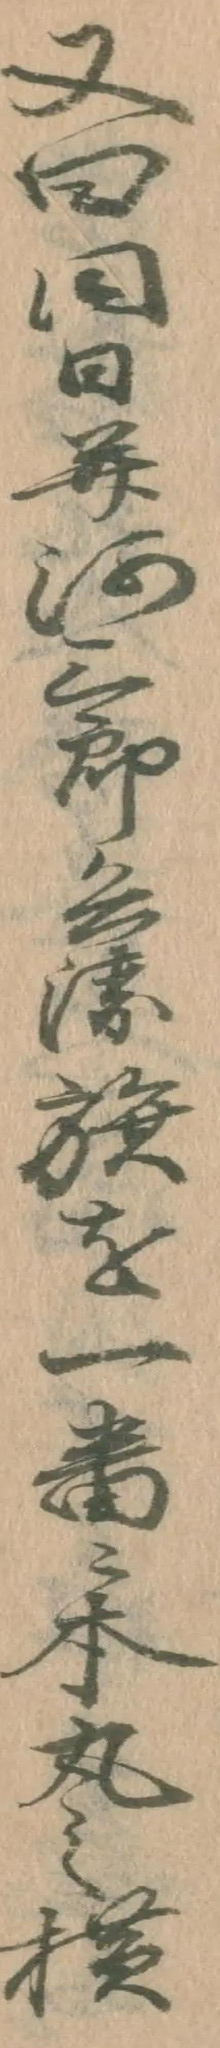又曰同日並河三郎兵庫旗を一番に本丸之横
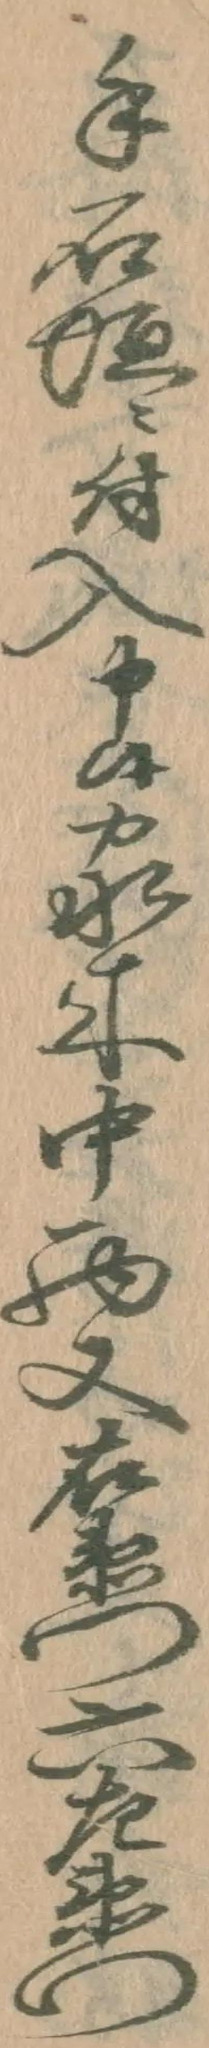手石垣に付入申候家来中西又右衛門六左衛門
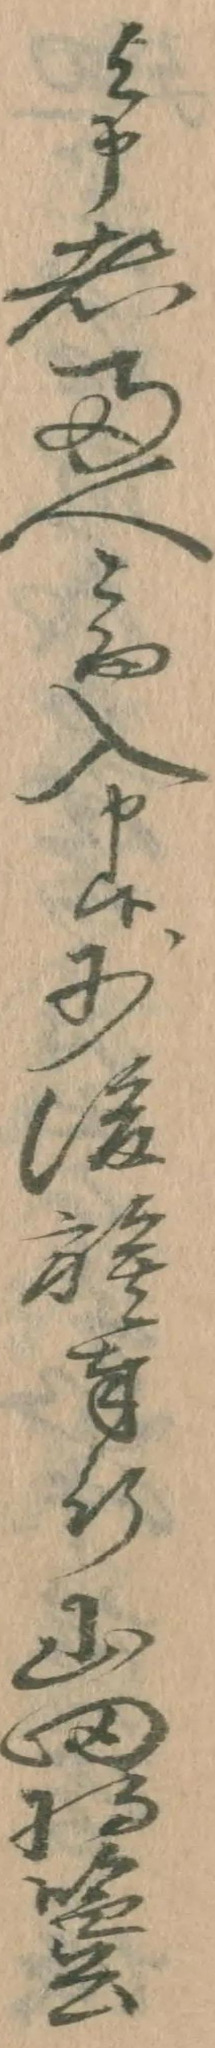与申者両人に而入申候少後旗奉行山田将監兵
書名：切支丹御退治記 49巻. [8]
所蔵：国立国会図書館 National Diet Library, JAPAN
